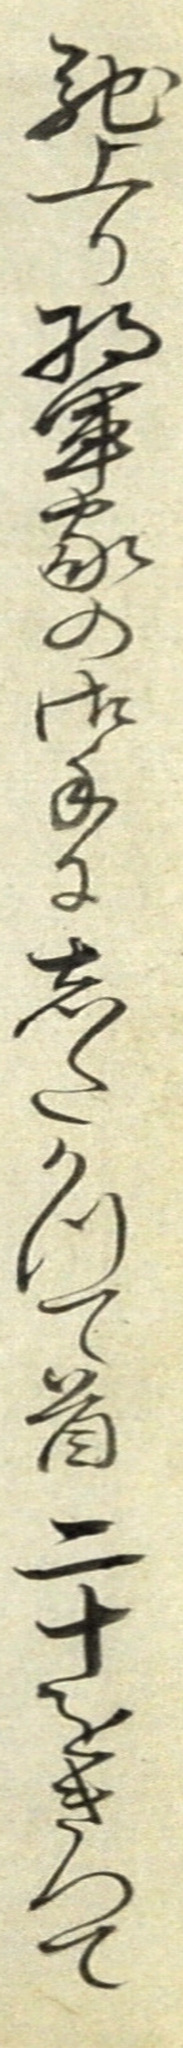馳上り将軍家の御手にしたかつて首二十をきつて
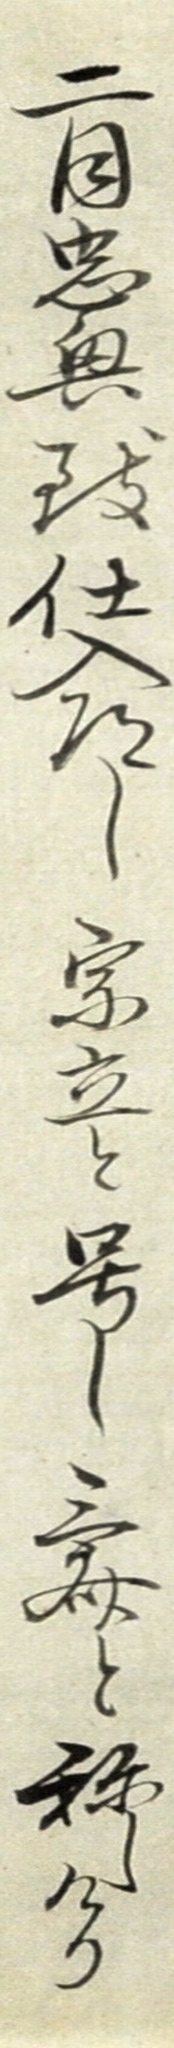二月忠興致仕入道し宗立と号し三斎と称しけり
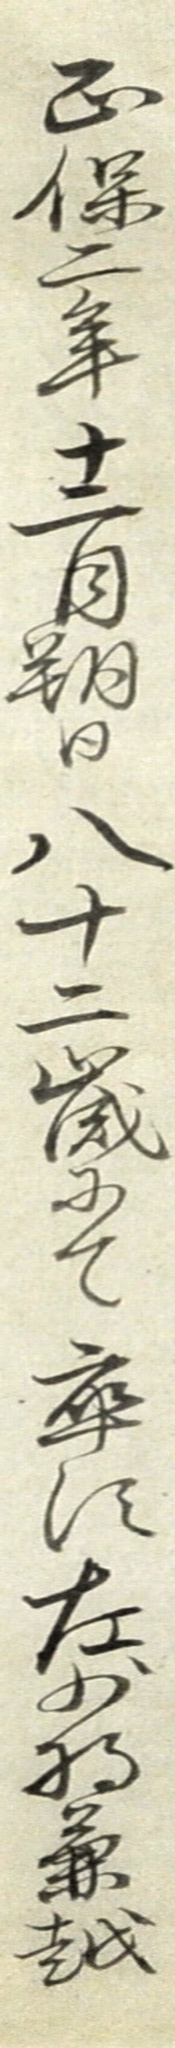正保二年十二月朔日八十二歳にて卒す左少将兼越
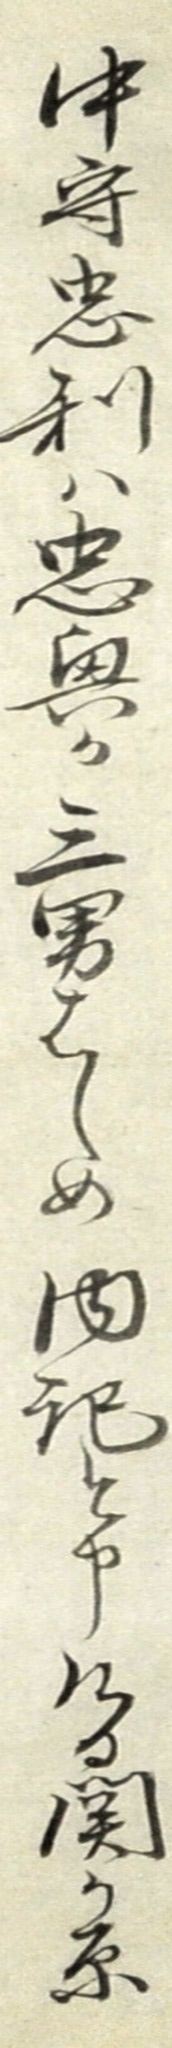中守忠利は忠興か三男はしめ内記と申ける関ヶ原
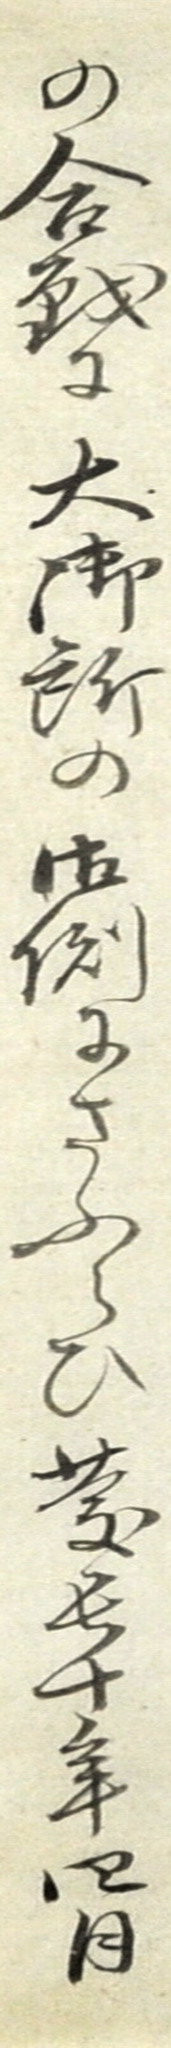の合戦に大御所の御側にさふらひ慶長十年四月
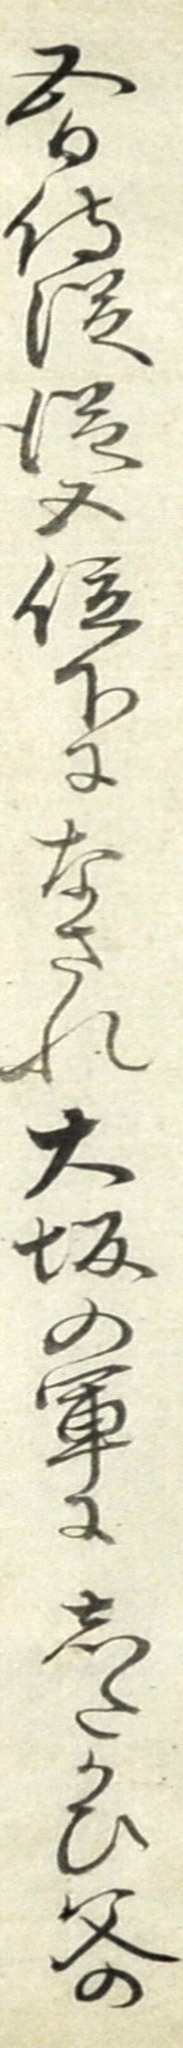五日侍従従五位下になされ大坂の軍にしたかひ父の
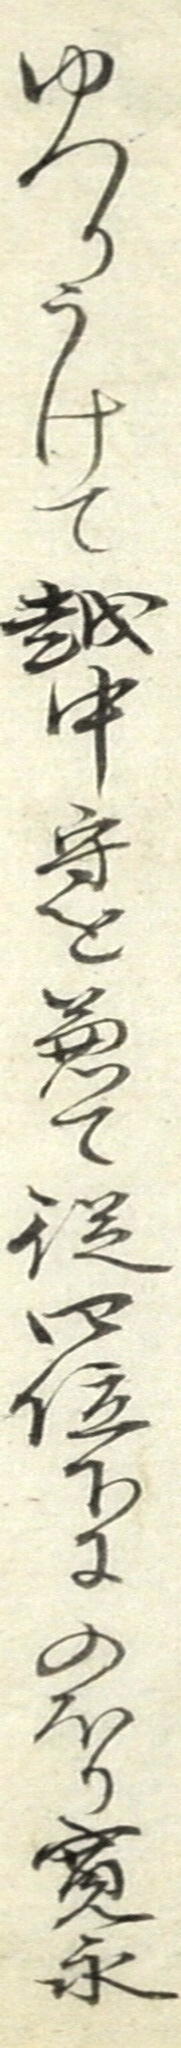ゆつりうけて越中守を兼て従四位下にのほり寛永
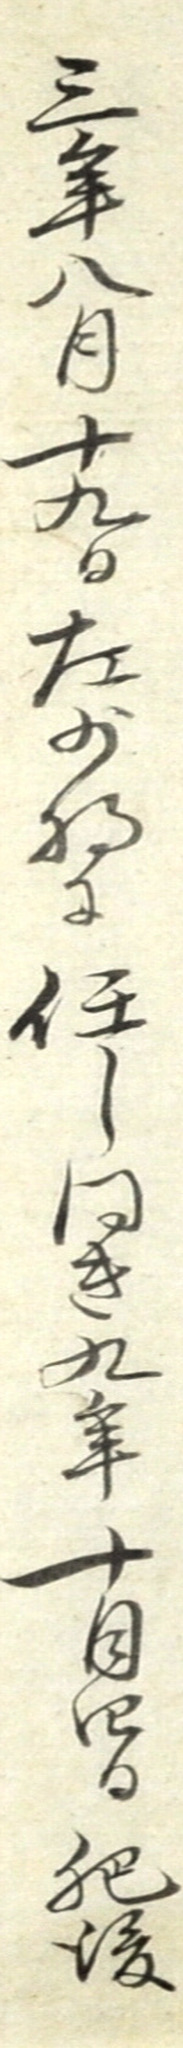三年八月十九日左少将に任し同き九年十月四日肥後
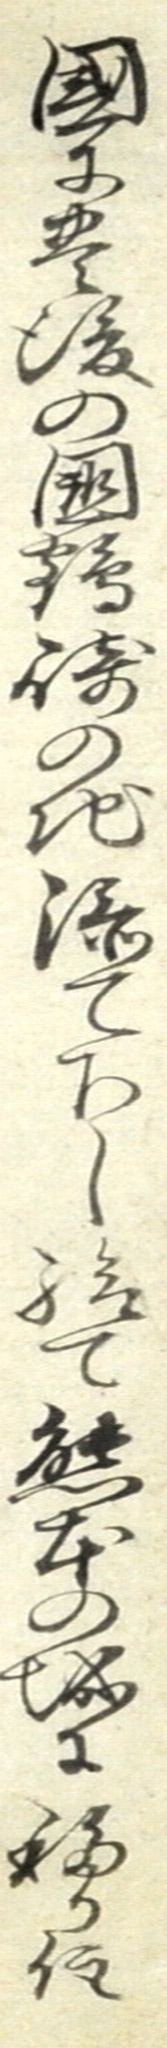国に豊後の国鶴崎の地添て下し給て熊本の城に移りす住
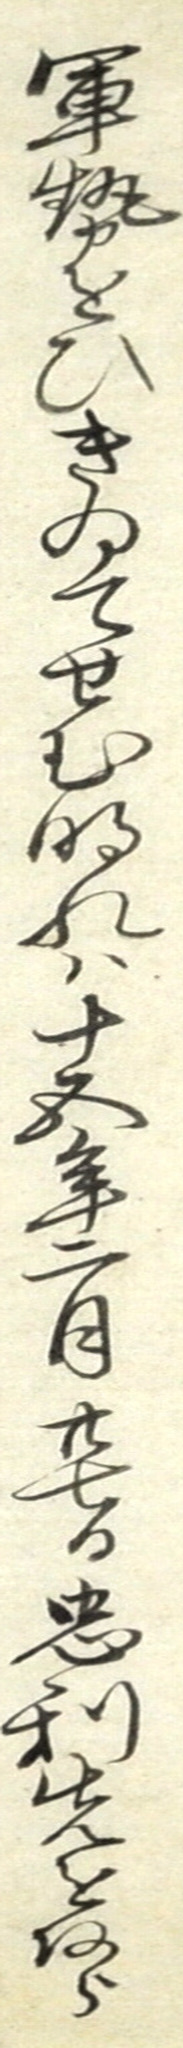軍勢をひきゐてせむ明れは十五年二月二十七日忠利先をあら
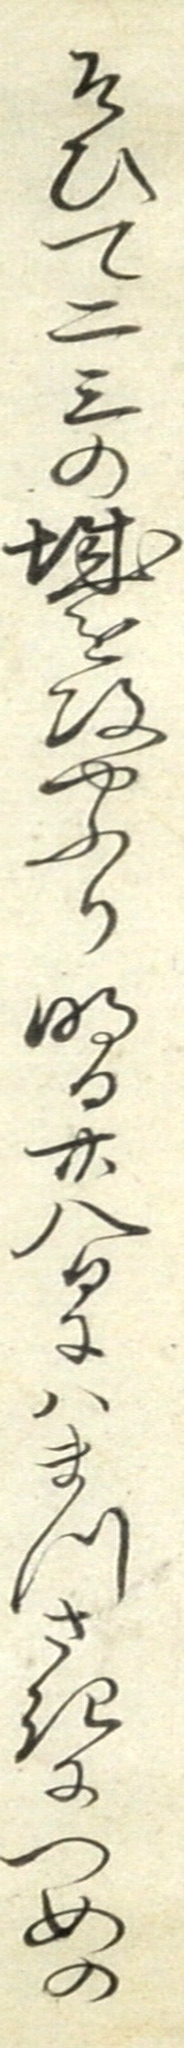そひて二三の城を攻やふり明る廿八日にはまつさきにつめの
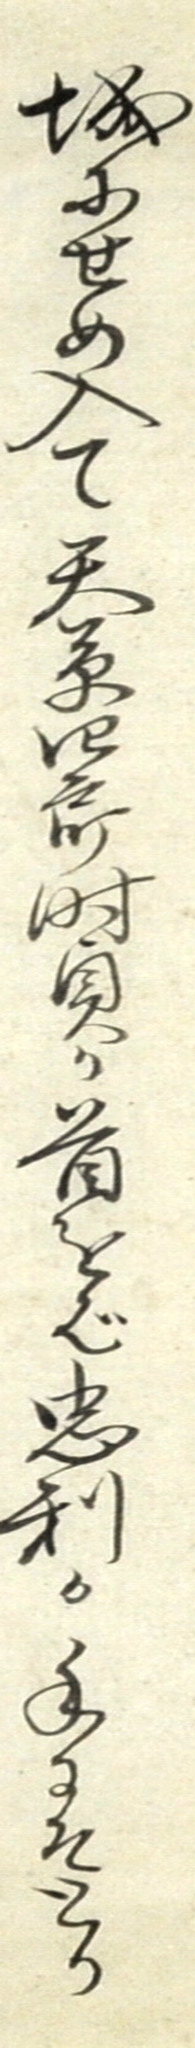城にせめ入て天草四郎時貞か首をば忠利か手にそとり
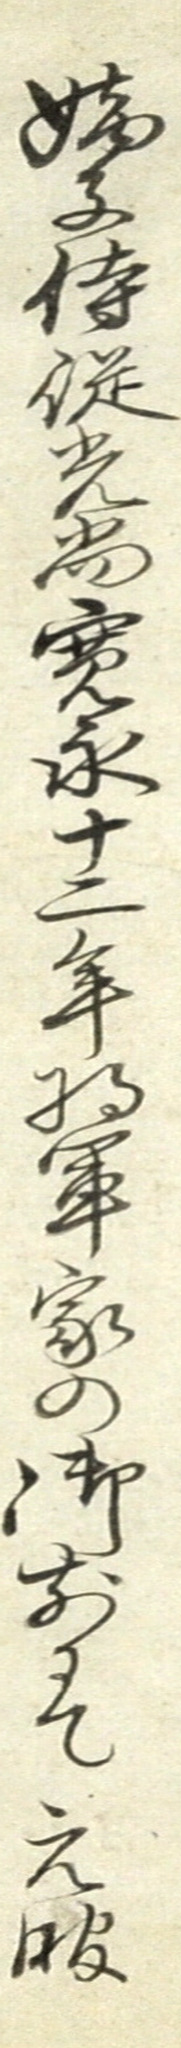嫡子侍従光尚寛永十二年将軍家の御前にて元服
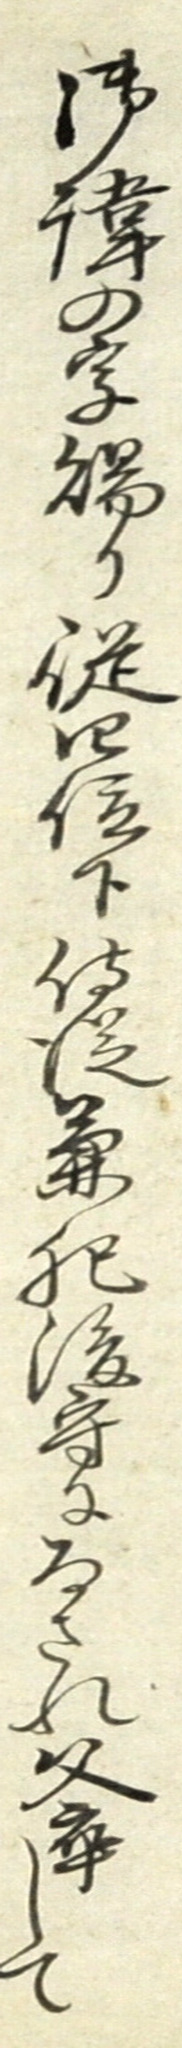御諱の字賜り従四位下侍従兼肥後守になされ父卒して
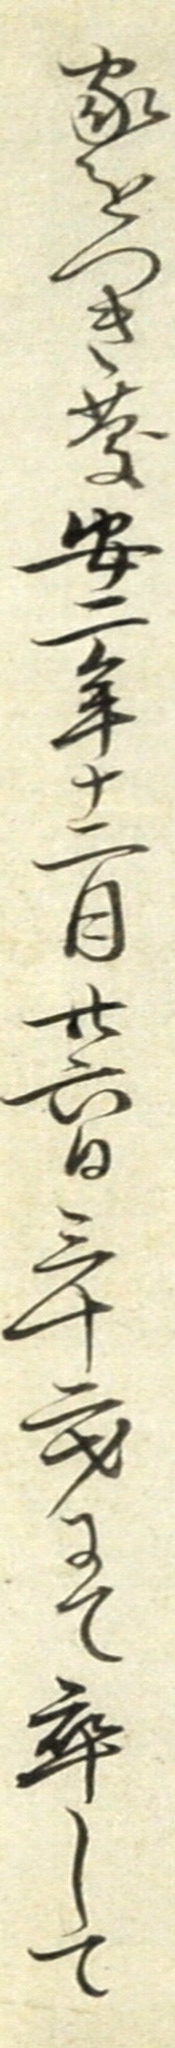家をつき慶安二年十二月廿六日三十二才にて卒して
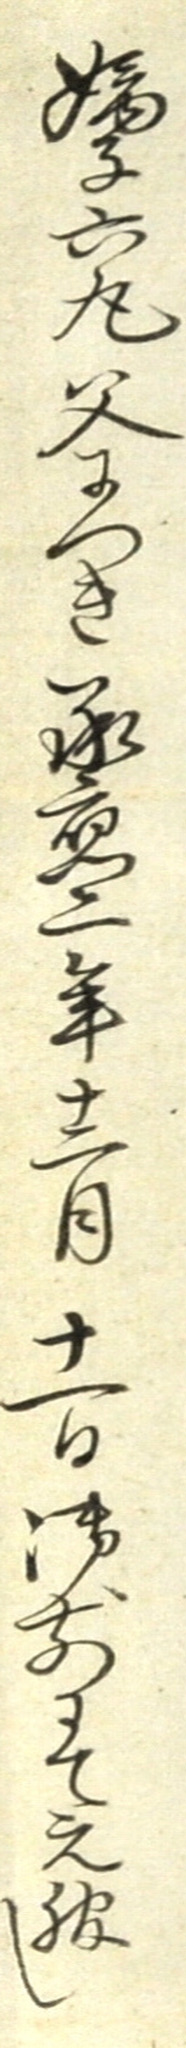嫡子六丸父につき承応二年十二月十一日御前にて元服し
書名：藩翰譜（七・下）
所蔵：伊那市立高遠町図書館・合同会社AMANE
